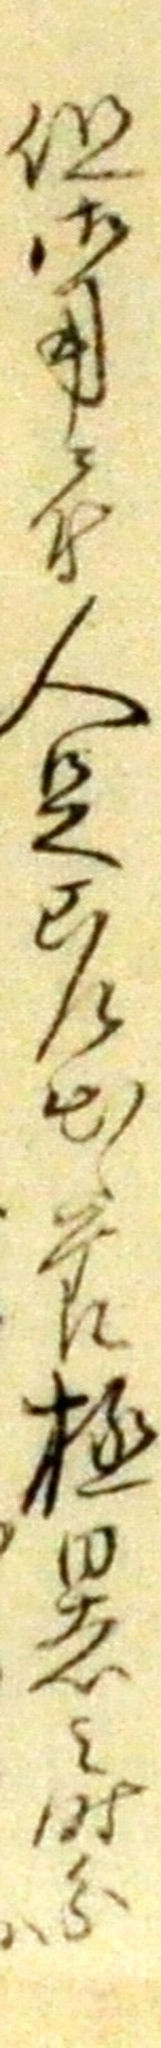但御用ニ付人足差出候節極暑之痔時分ハ
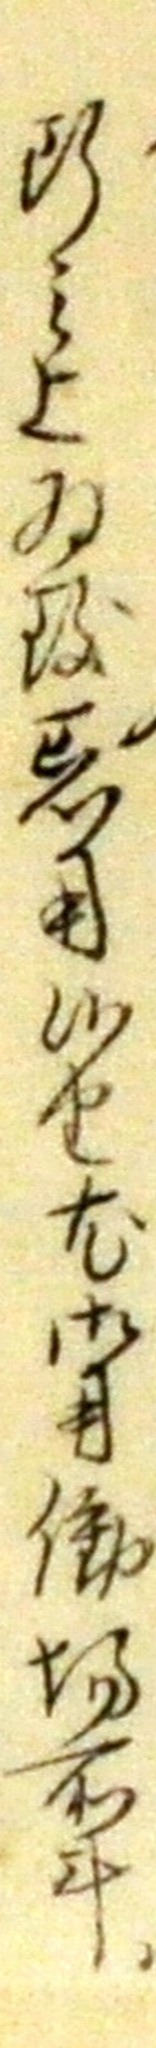断之上為致着用候由尤御用働場所計
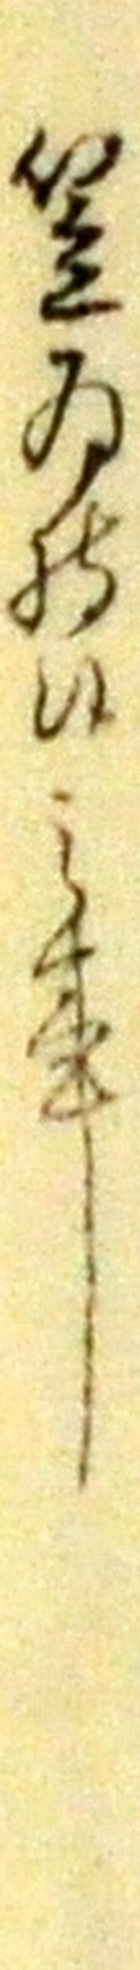笠為持候之事
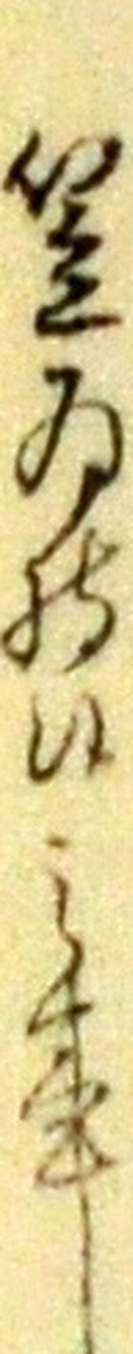笠為持候之事
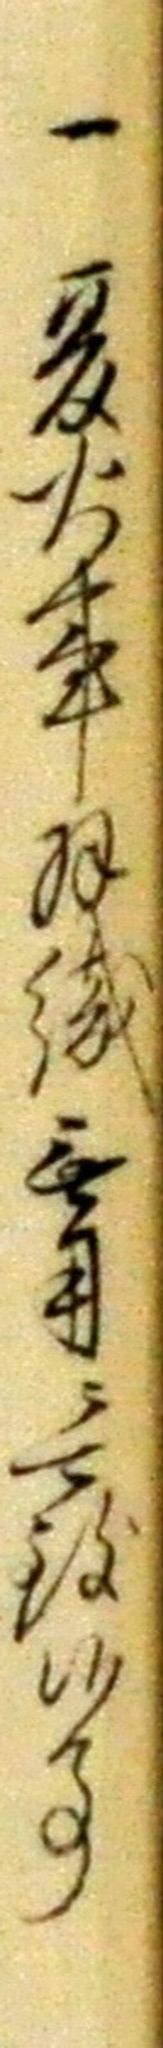一夏火事羽織無用二可致候事
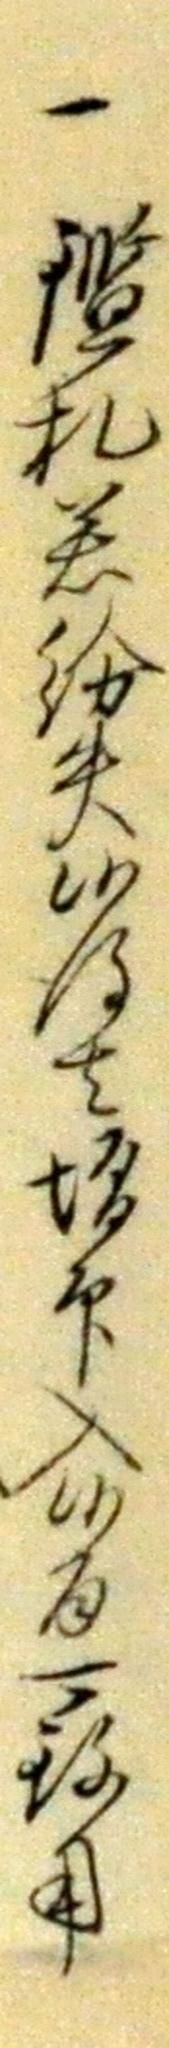一鑑札若紛候得は増印入候間可致用
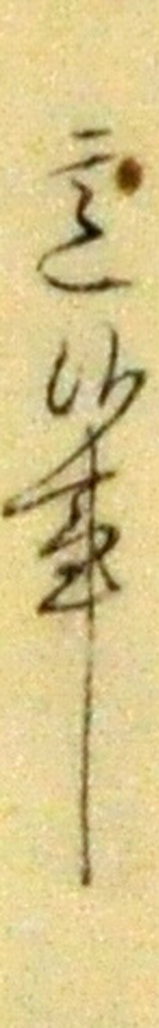意候事
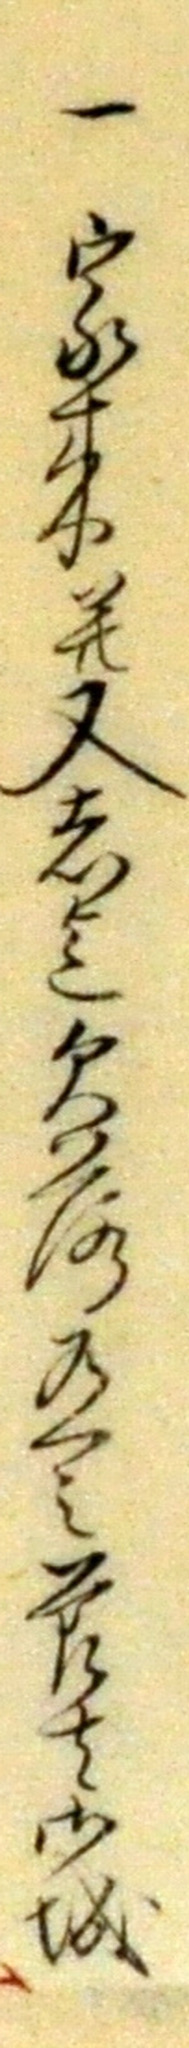一家来并又者迄欠落有之節は御城
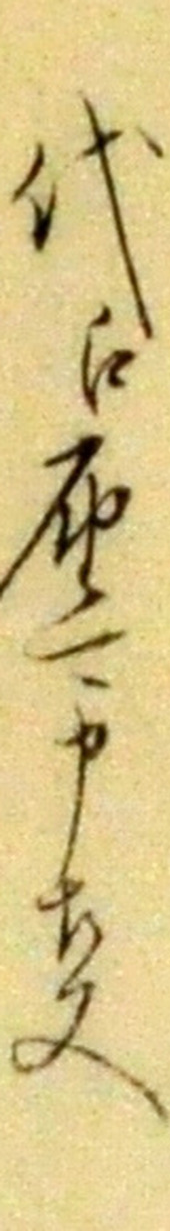代え届可申事
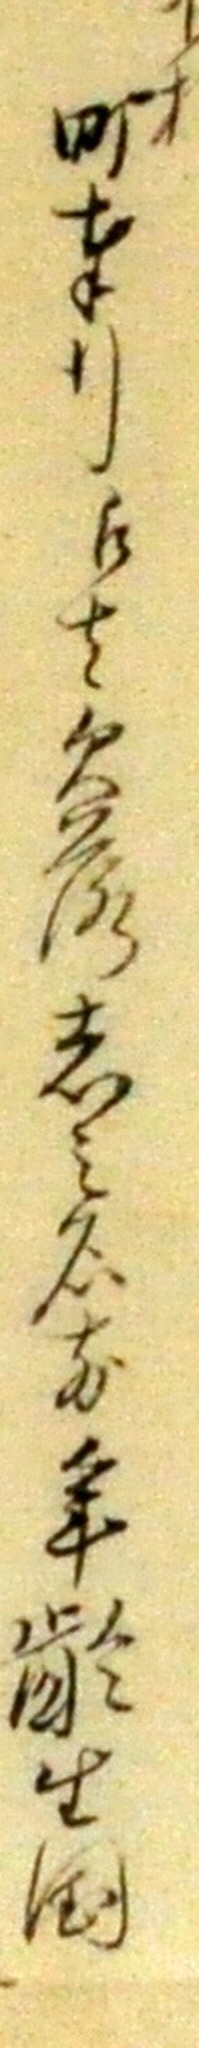町奉行えは欠落者之名前年齢生国共二
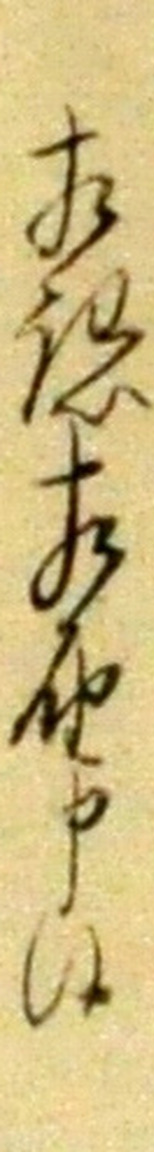相認相届申候
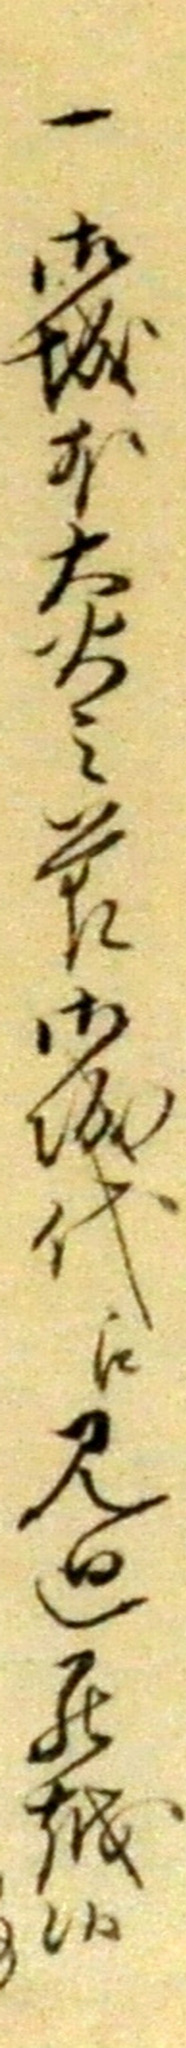一御城外大火之節御城代え見廻罷越候事
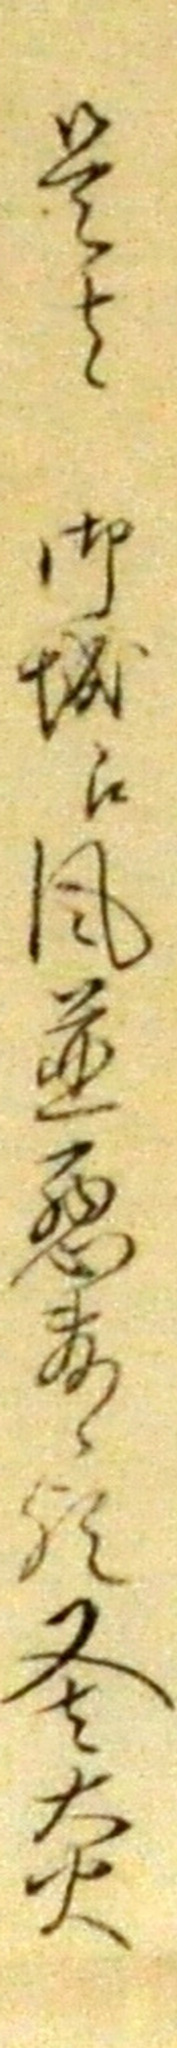是は御城え風並悪敷候歟又は大火
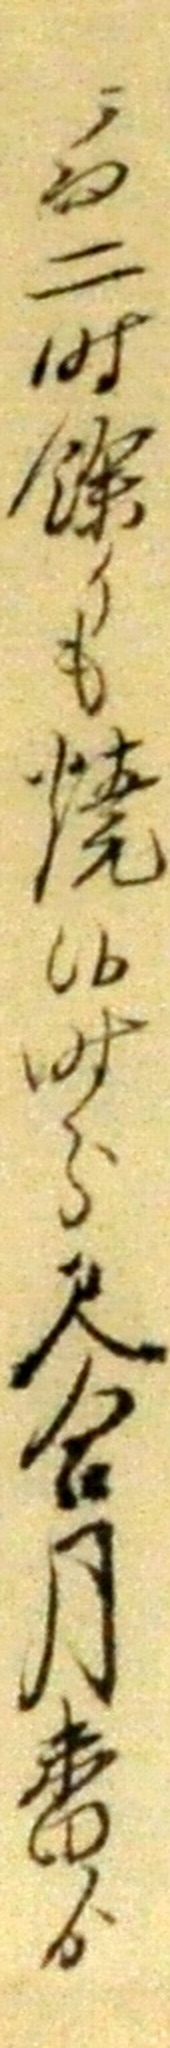ニ而二時余りも焼候時分見合月番ゟ
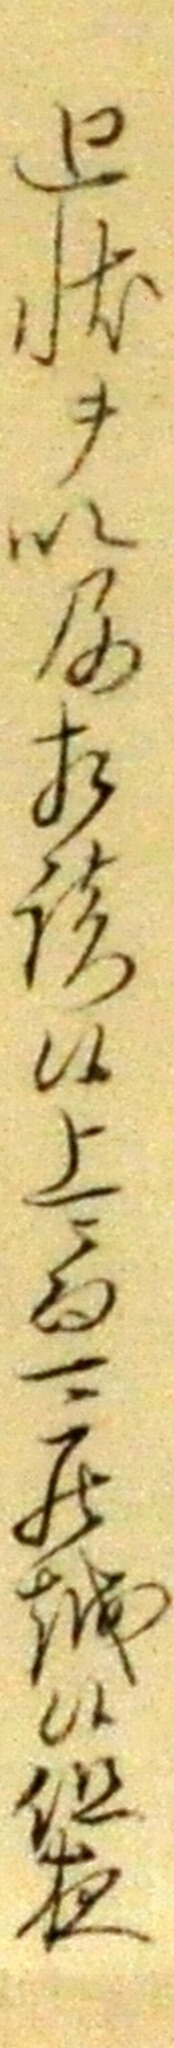廻状ヲ以及相談候上ニ而可罷越候但夜
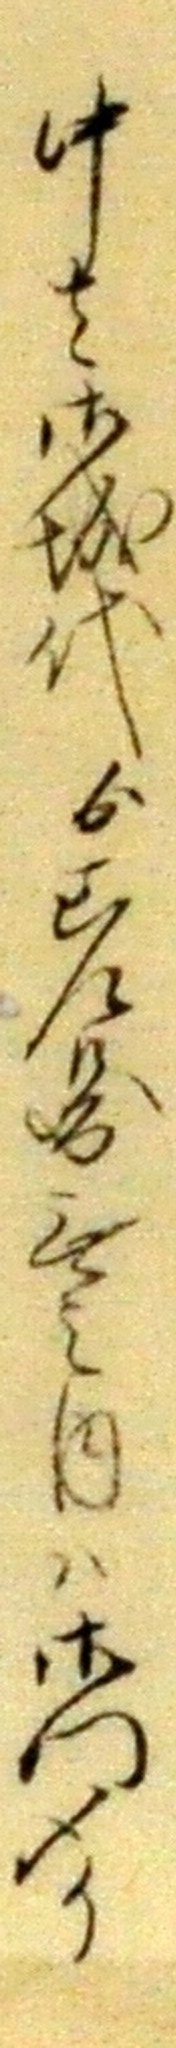中は御城代ゟ差図無之内ハ御門〆り
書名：大阪加番関係諸書留〔一括〕
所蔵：伊那市立高遠町図書館・合同会社AMANE
